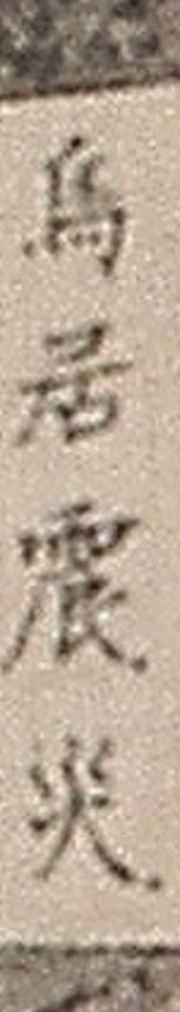鳥居震災
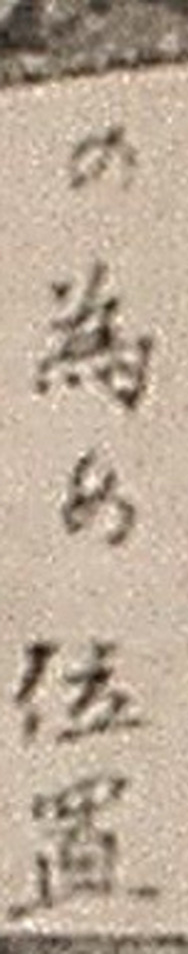の為め位置
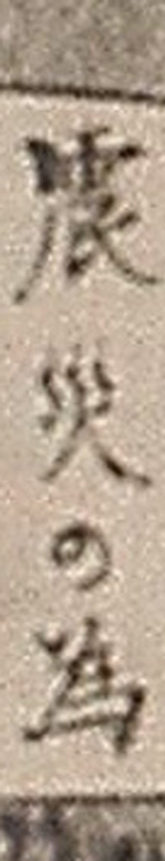震災の為
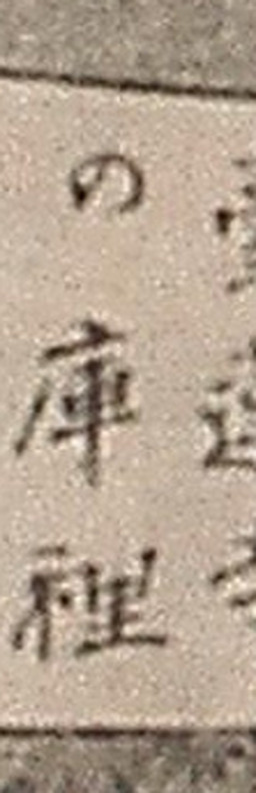の庫裡
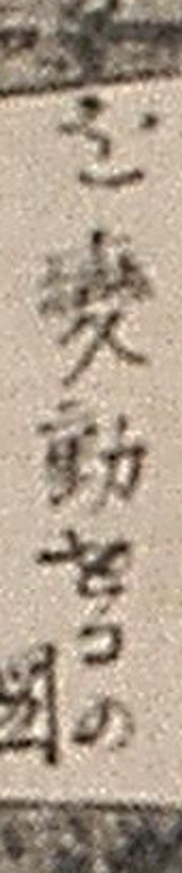を変動するの
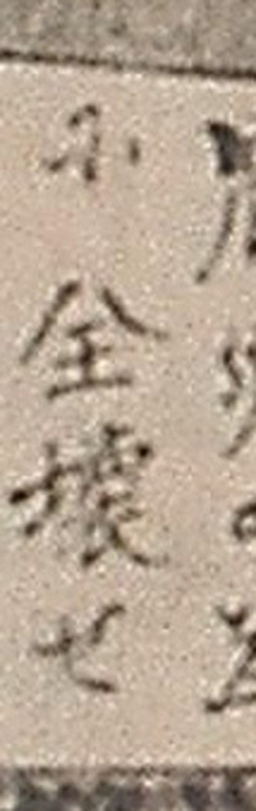に全壊せ

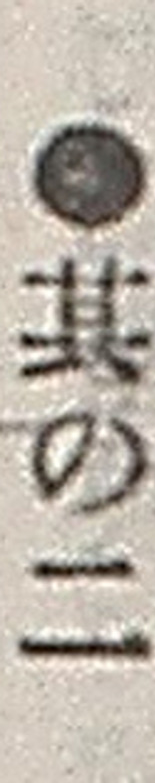●其のニ
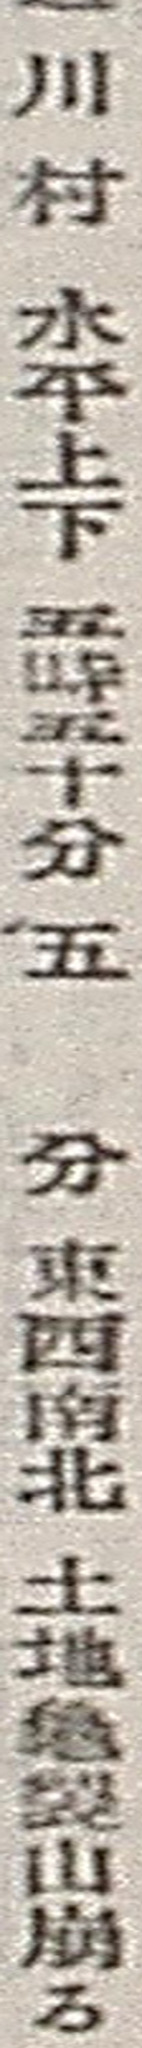豊川村水平上下五時五十分五分東西南北土地亀裂山崩る
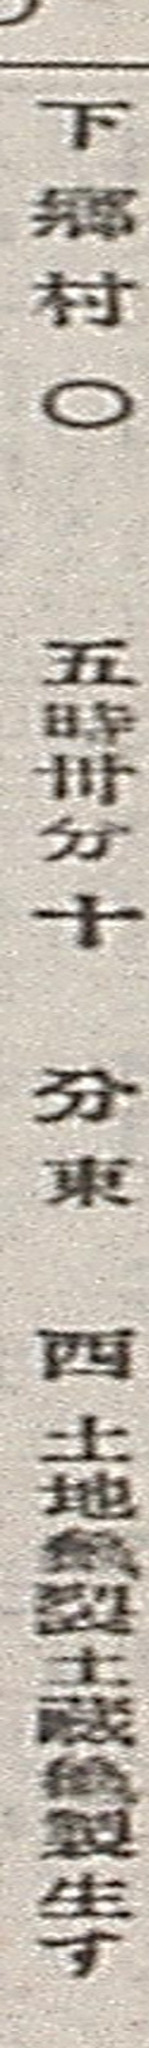下郷村〇五時卅分十分東西土地亀裂土蔵亀裂生ず
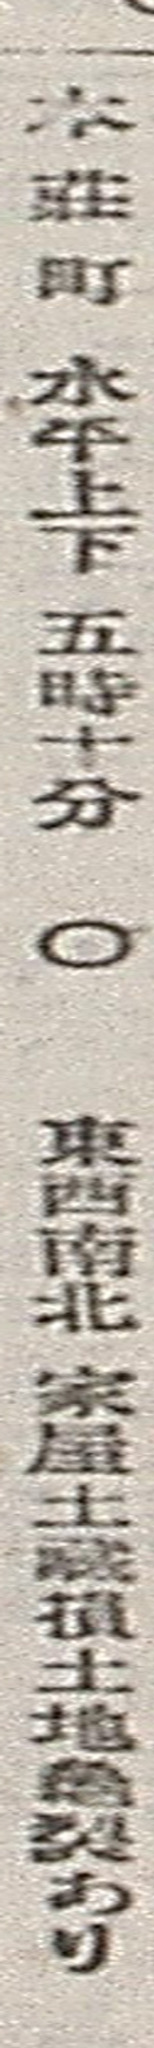本荘町水平上下五時十分〇東西南北家屋土蔵損土地亀裂あり
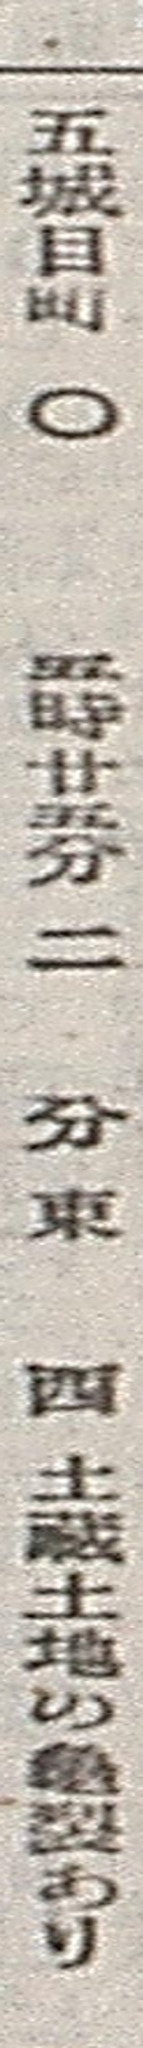五城目町〇五時廿分二分東西土蔵土地の亀裂あり
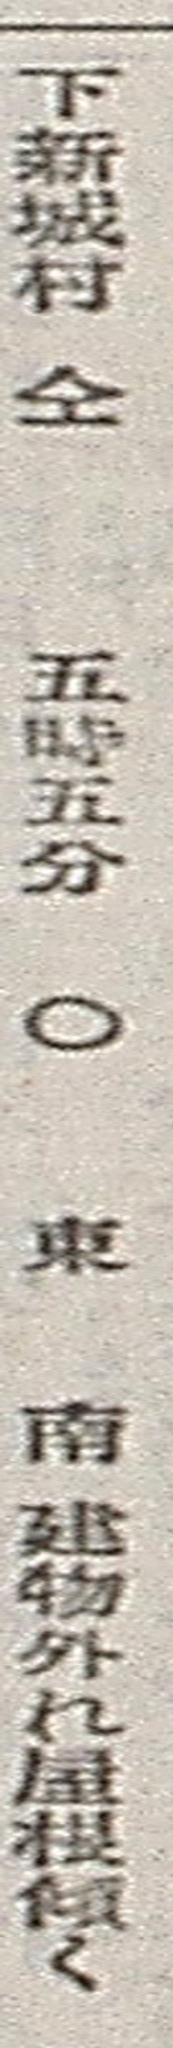下新城村仝五時五分〇東南建物外れ屋根傾く
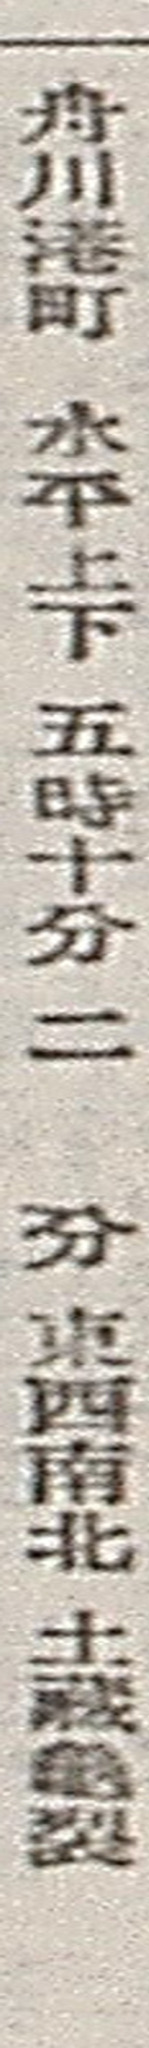舟川港町水平上下五時十分二分東西南北土蔵亀裂
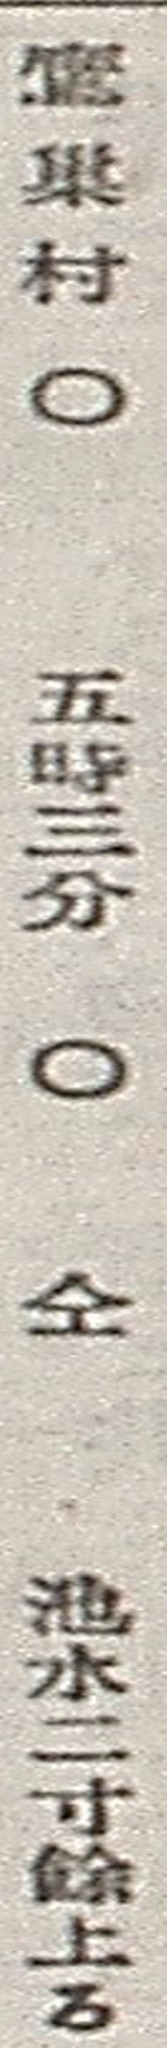鷹巣村〇五時三分〇仝池水二寸余上る
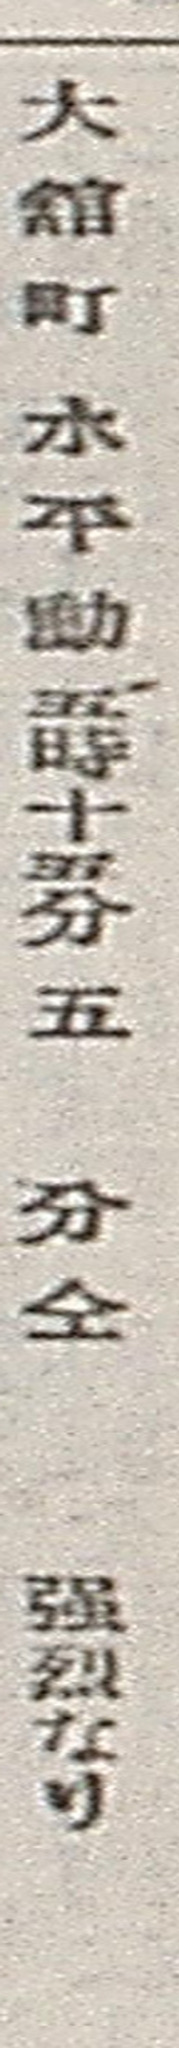大舘町水平動五時十五分五分仝強烈なり
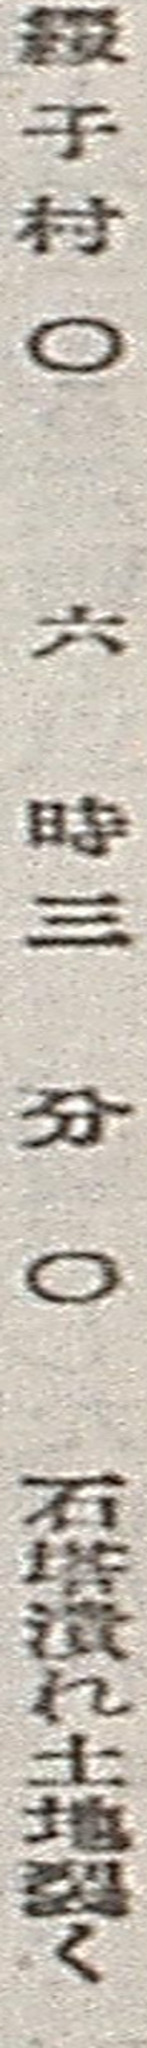笹子村〇六時三分〇石塔潰れ土地裂く
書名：風俗畫報臨時増刊第百二十四號　洪水地震被害録（上）
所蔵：東京大学地震研究所図書室 Earthquake Research Institute Library, The University of Tokyo, JAPAN
